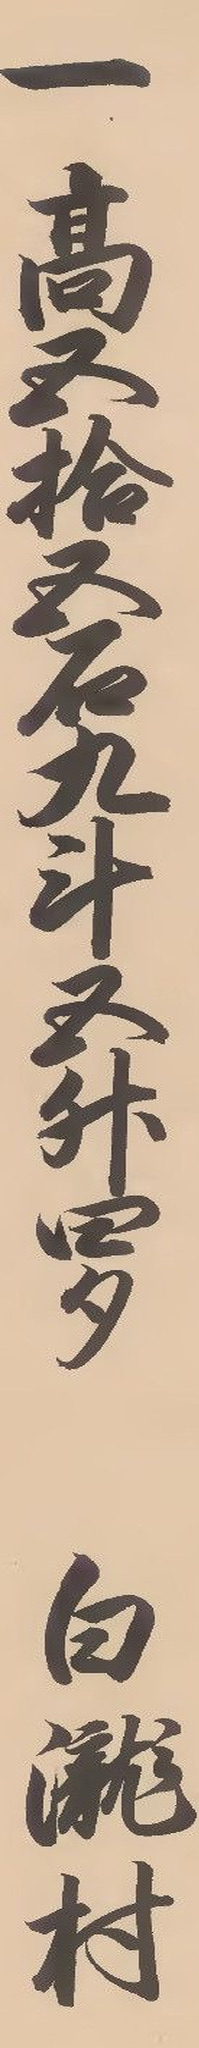一高五拾五石九斗五升四勺白瀧村
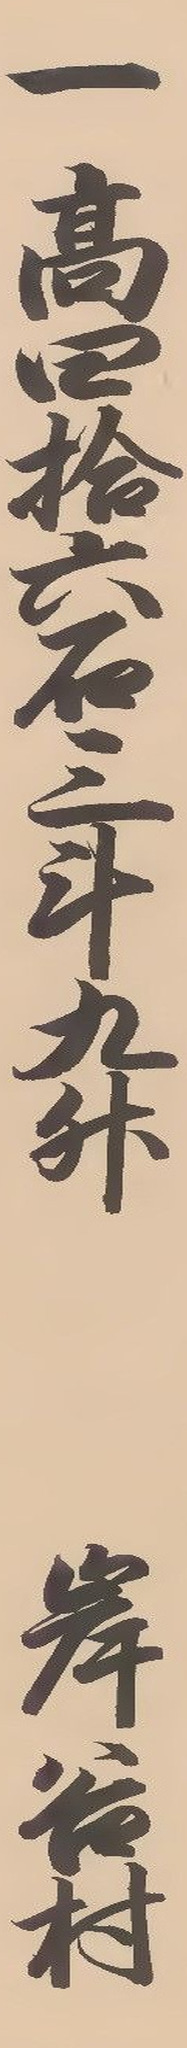一高四拾六石三斗九升岸谷村
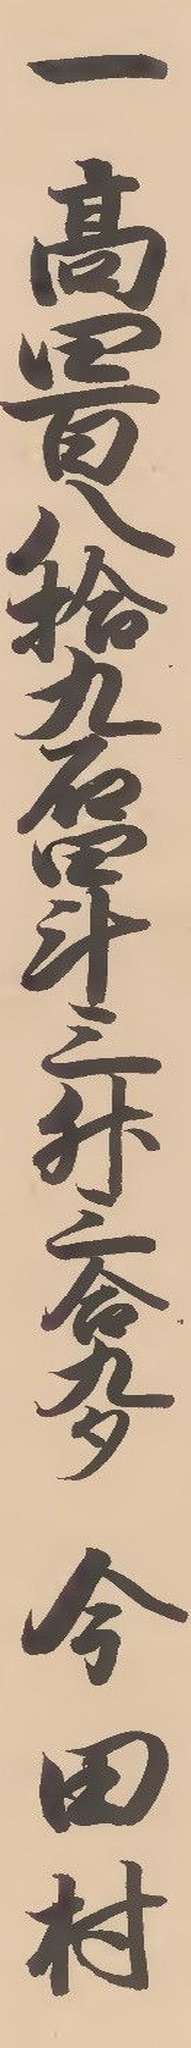一高四百八拾九石四斗三升三合九勺今田村
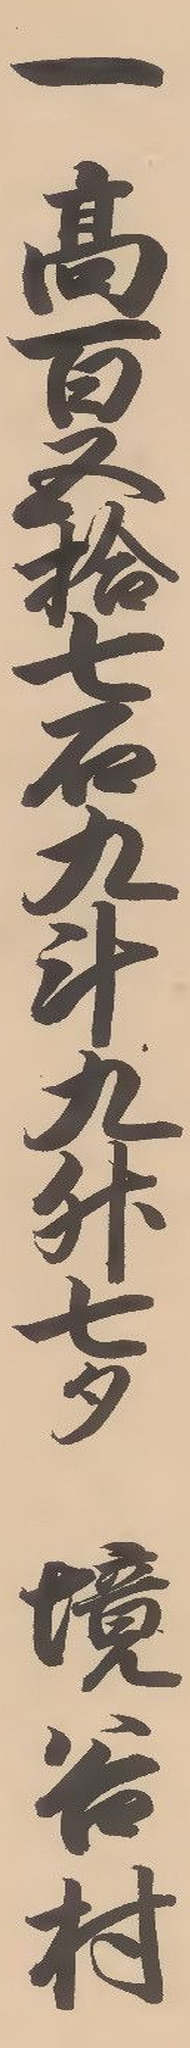一高百五拾七石九斗九升七勺境谷村
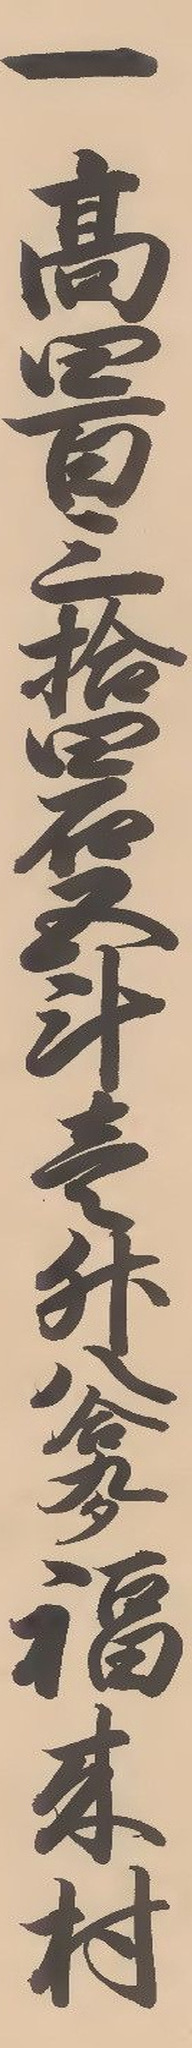一高四百三拾四石五斗壱升八合九勺福来村
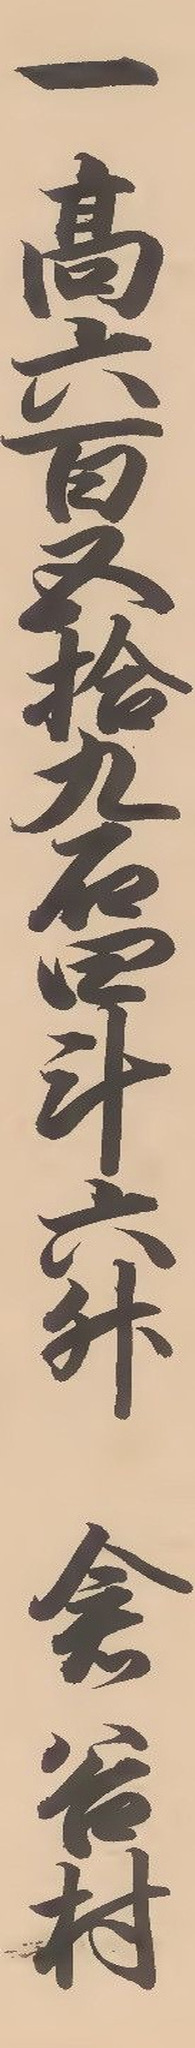一高六百五拾九石四斗六升倉谷村
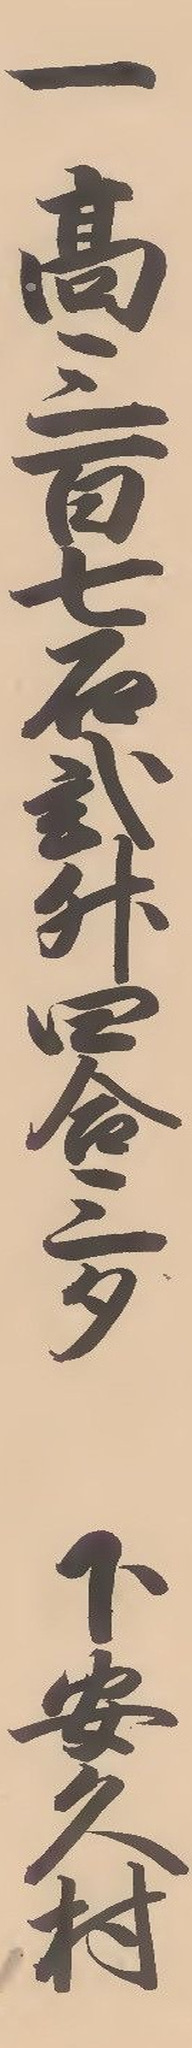一高三百七石弐升四合三勺下安久村

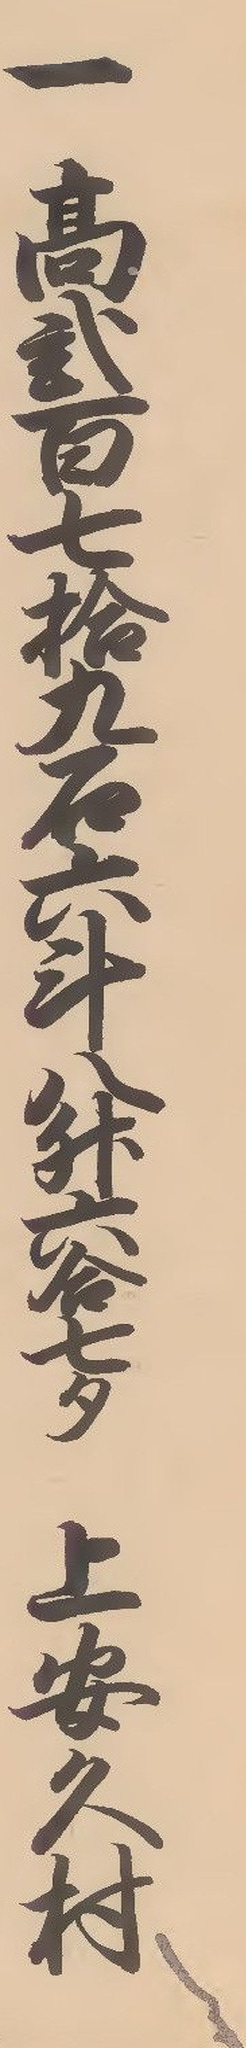一高弐百七拾九石六斗八升六合七勺上安久村
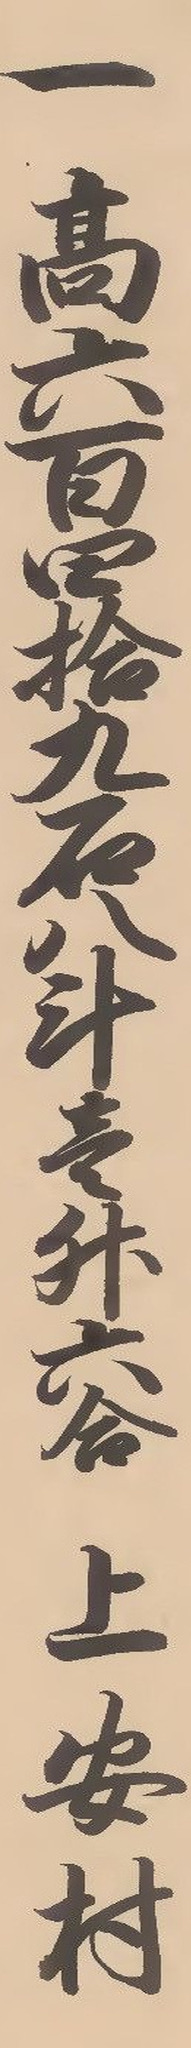一高六百四拾九石八斗壱升六合上安村
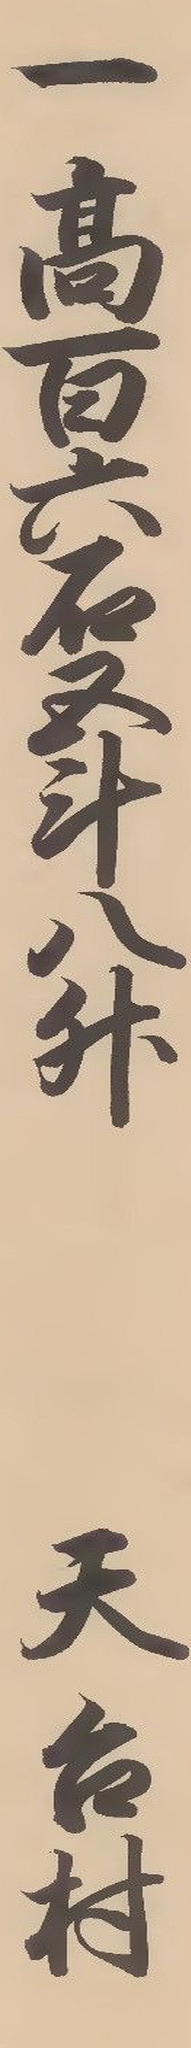一高百六石五斗八升天台村
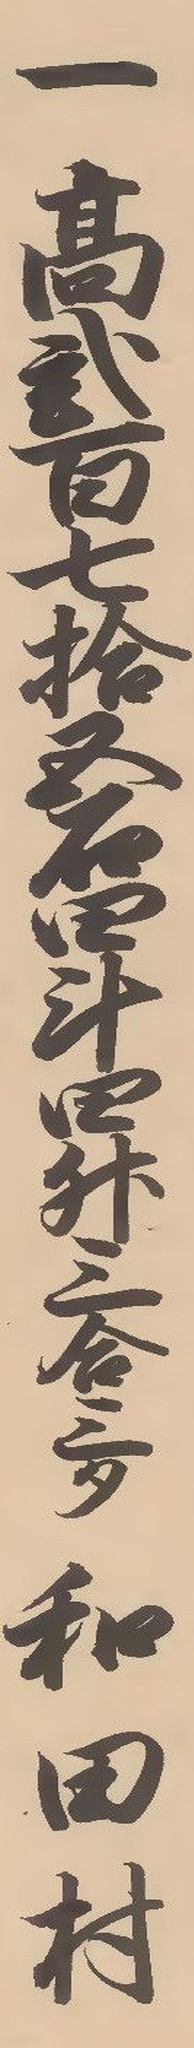一高弐百七拾五石四斗四升三合三勺和田村
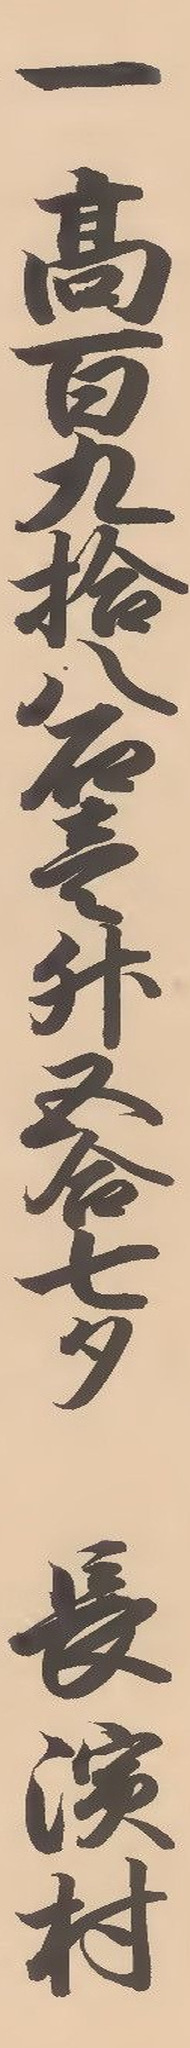一高百九拾八石壱升五合七勺長浜村
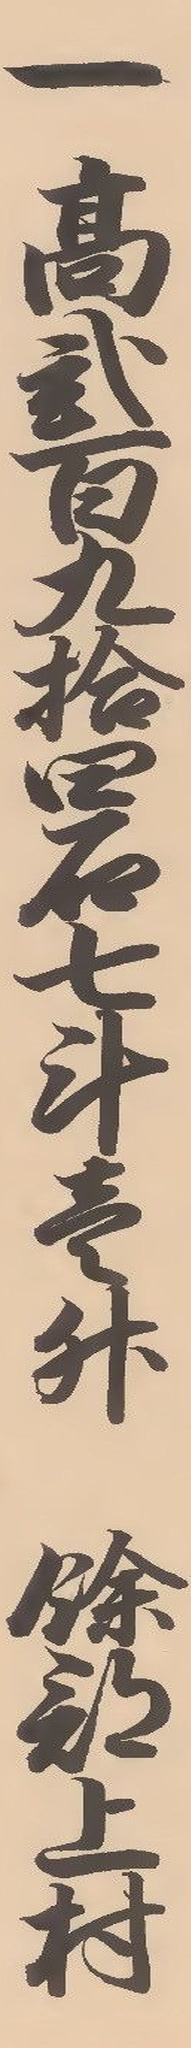一高弐百九拾四石七斗壱升余部上村
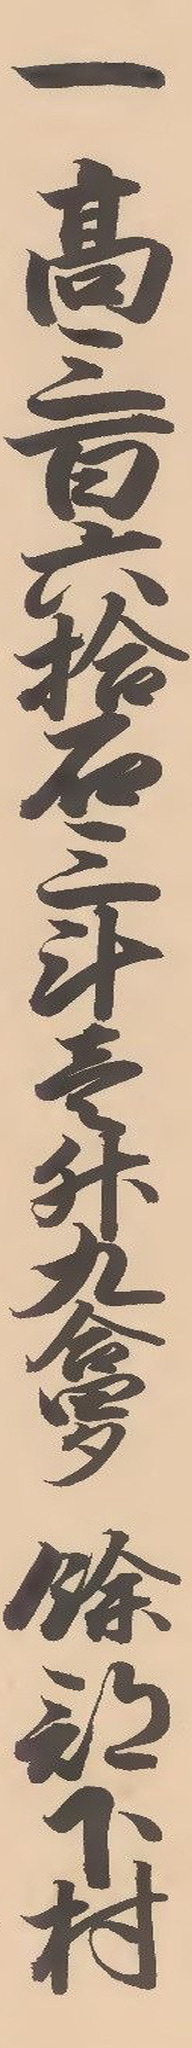一高三百六拾石三斗壱升九合四勺余部下村
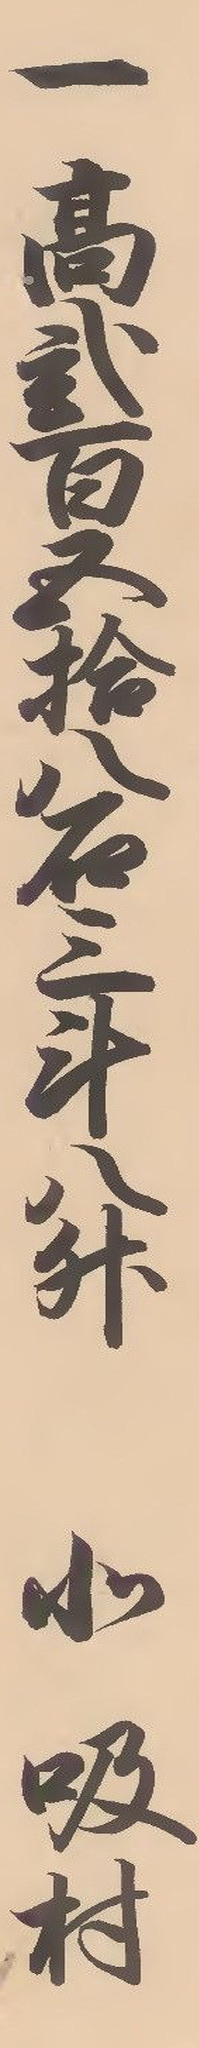一高弐百五拾八石三斗八升北吸村

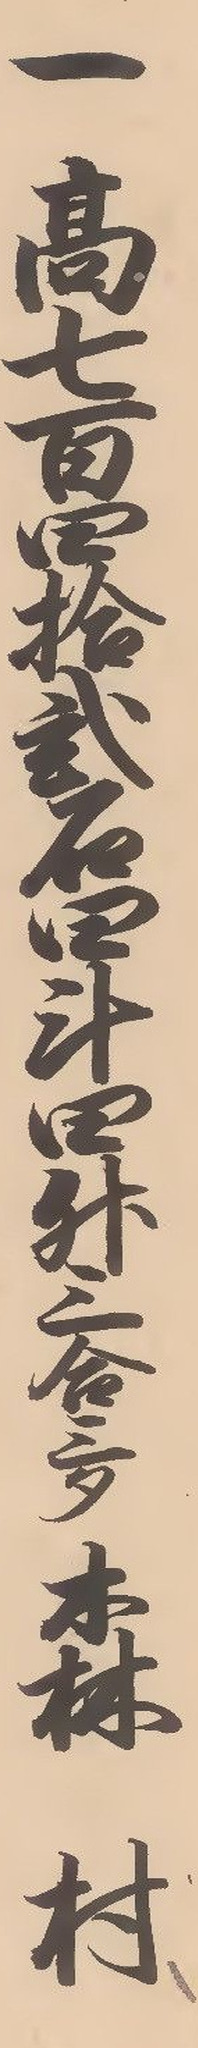一高七百四拾弐石四斗四升三合三勺森村
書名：丹後国郷帳
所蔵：国立公文書館 National Archives of Japan
